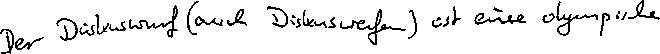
Der Diskuswurf (auch Diskuswerfen) ist eine olympische
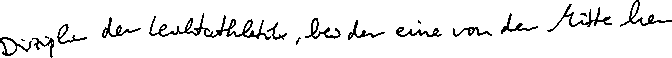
Disziplin der Leichtathletik, bei der eine von der Mitte her
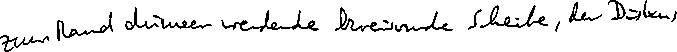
zum Rand dünner werdende kreisrunde Scheibe, der Diskus
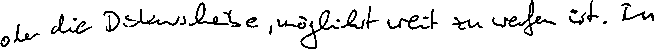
oder die Diskusscheibe, möglichst weit zu werfen ist. In
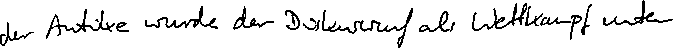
der Antike wurde der Diskuswurf als Wettkampf unter
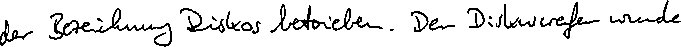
der Bezeichnung Diskos betrieben. Der Diskuswerfer wurde
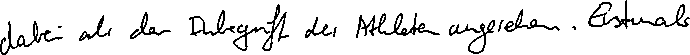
dabei als der Inbegriff des Athleten angesehen. Erstmals
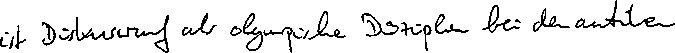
ist Diskuswurf als olympische Disziplin bei den antiken
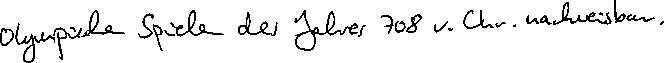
Olympischen Spielen des Jahres 708 v. Chr. nachweisbar.
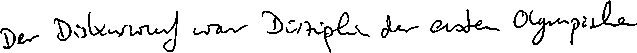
Der Diskuswurf war Disziplin der ersten Olympischen
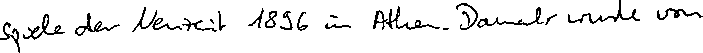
Spiele der Neuzeit 1896 in Athen. Damals wurde von
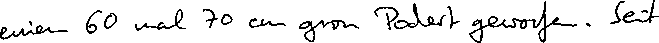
einem 60 mal 70 cm großen Podest geworfen. Seit
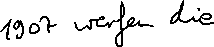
1907 werfen die
